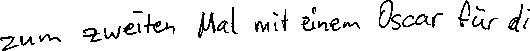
zum zweiten Mal mit einem Oscar für di
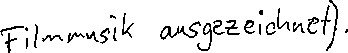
Filmmusik ausgezeichnet).
